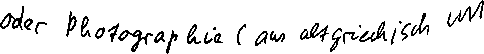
oder Photographie (aus altgriechisch im
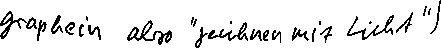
graphein also "zeichnen mit Licht")
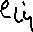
ein
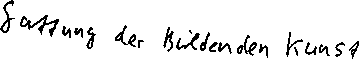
Gattung der Bildenden Kunst
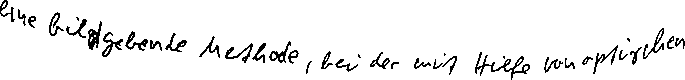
eine bildgebende Methode, bei der mit Hilfe von optischen
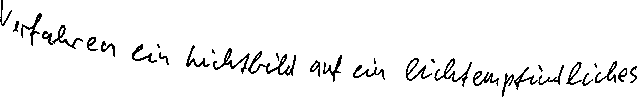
Verfahren ein Lichtbild auf ein lichtempfindliches
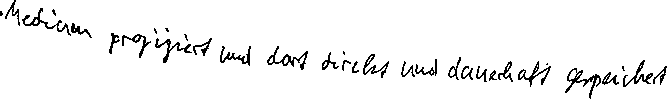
Medium projiziert und dort direkt und dauerhaft gespeichert
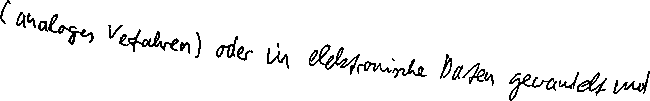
(analoges Verfahren) oder in elektronische Daten gewandelt und
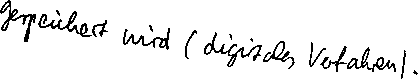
gespeichert wird (digitales Verfahren).
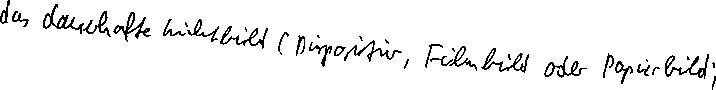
das dauerhafte Lichtbild (Diapositiv, Filmbild oder Papierbild;
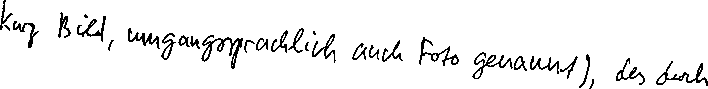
kurz Bild, umgangssprachlich auch Foto genannt), das durch
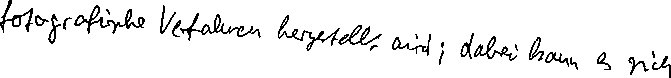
fotografische Verfahren hergestellt wird; dabei kann es sich
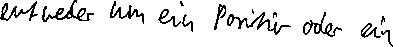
entweder um ein Positiv oder ein
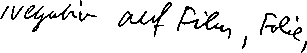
Negativ auf Film, Folie,
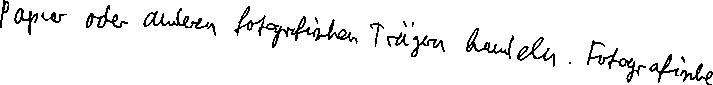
Papier oder anderen fotografischen Trägern handeln. Fotografische
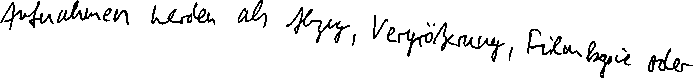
Aufnahmen werden als Abzug, Vergrößerung, Filmkopie oder
